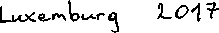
Luxemburg 2017
